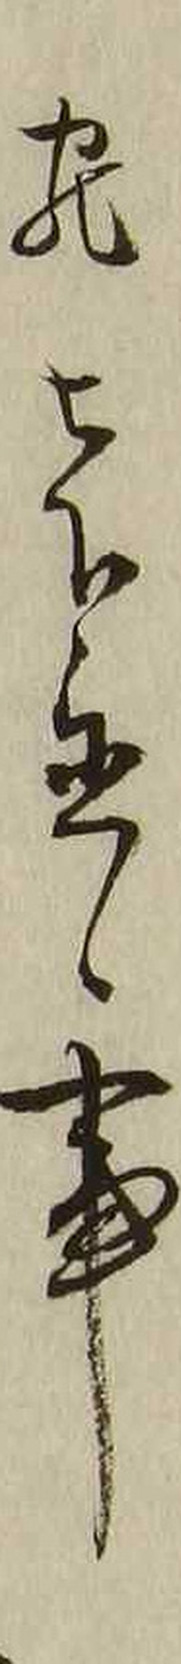宛被下置候事
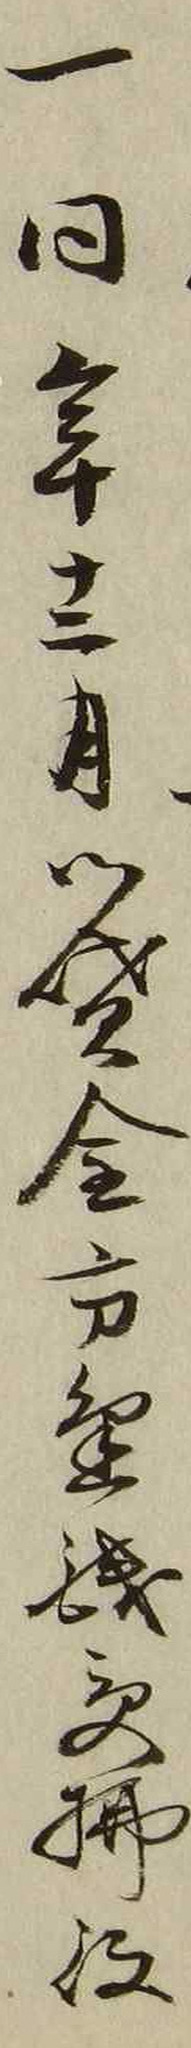一同年十二月御貸金方金銭受払役
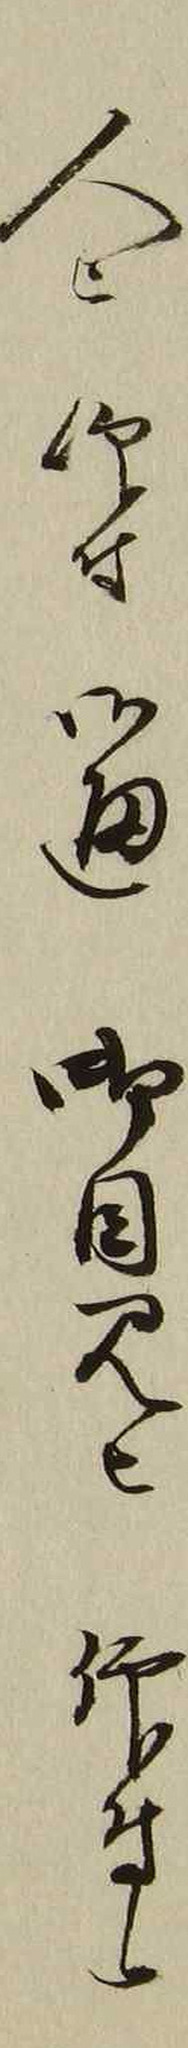人被仰付御通御目見被仰付候
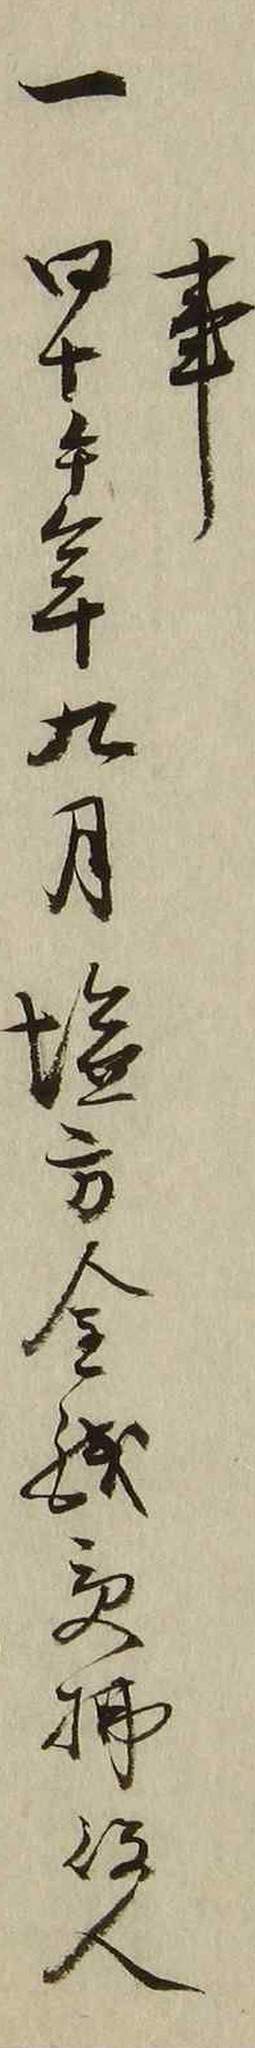一同十午年九月塩方金銭受払役人
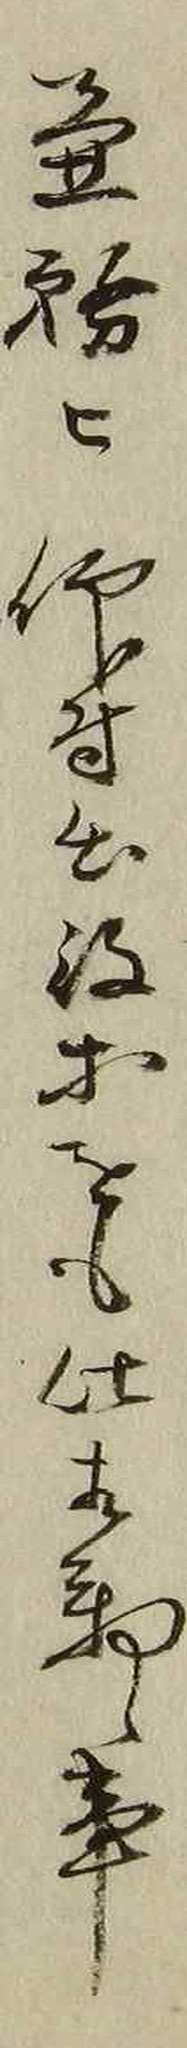兼務被仰付出役等をも仕相勤候事
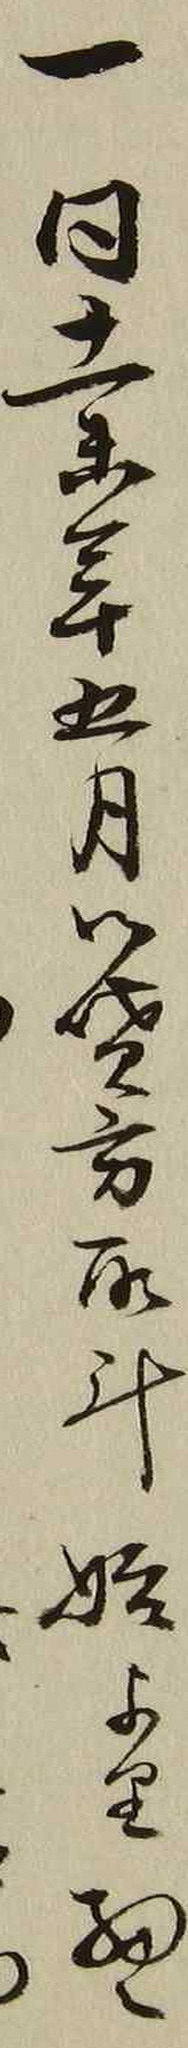一同十一未年五月御貸方取計始より細々
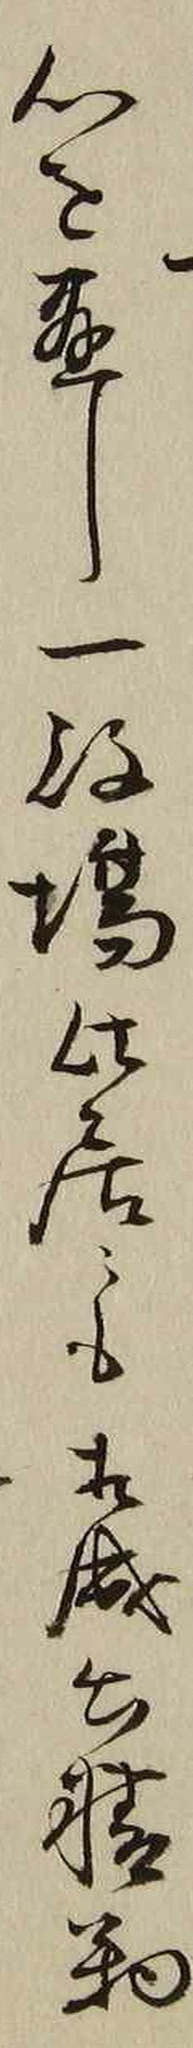心を尽し一役場仕居ニも相成出精勤
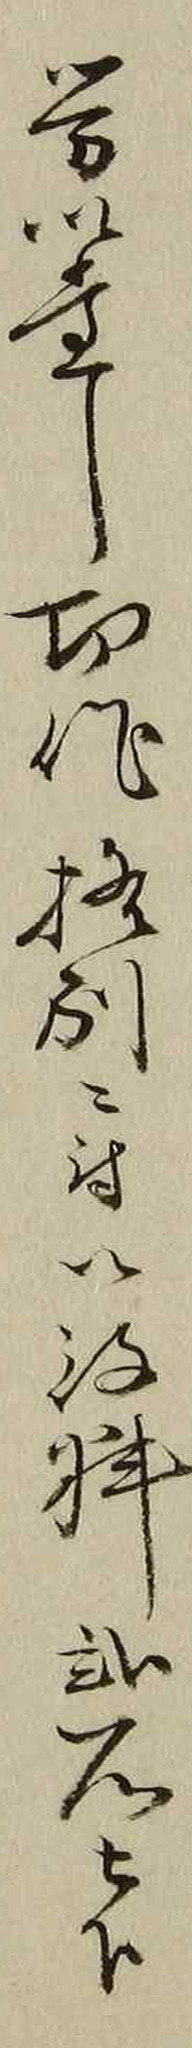労いたし功作格別ニ付御役料弐石被下
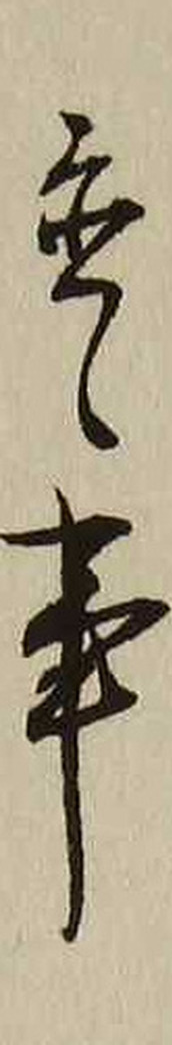置候事
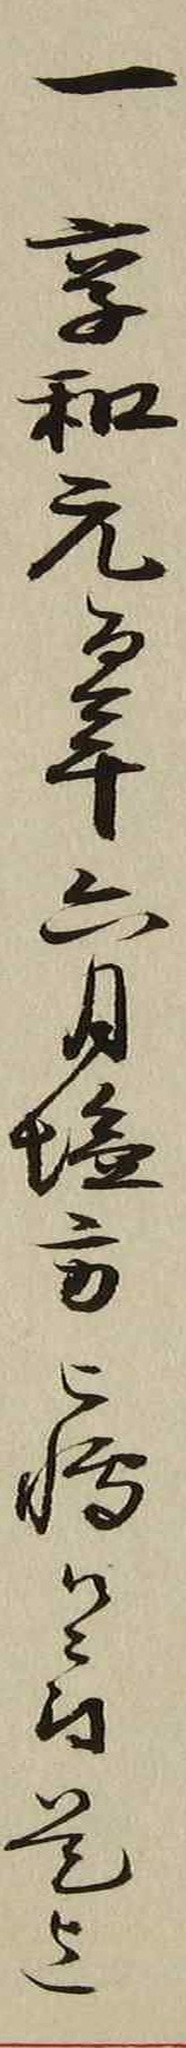一享和元酉年六月塩方被転候ニ付是迄
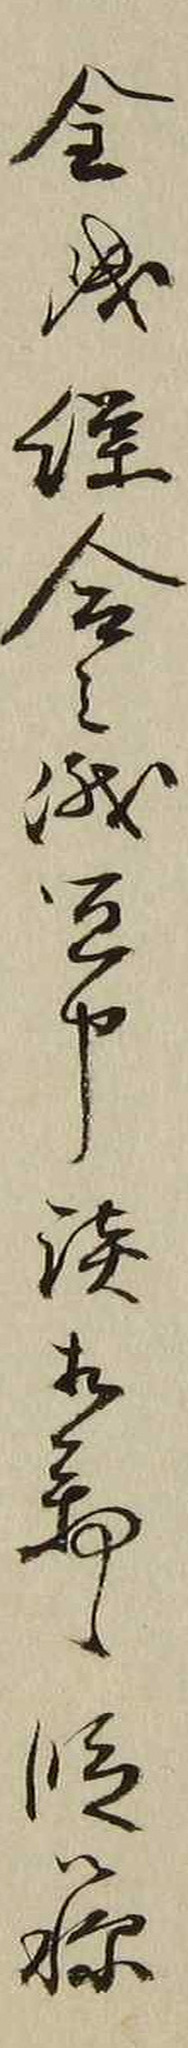金銭繰合之儀宜申談相勤候段御称
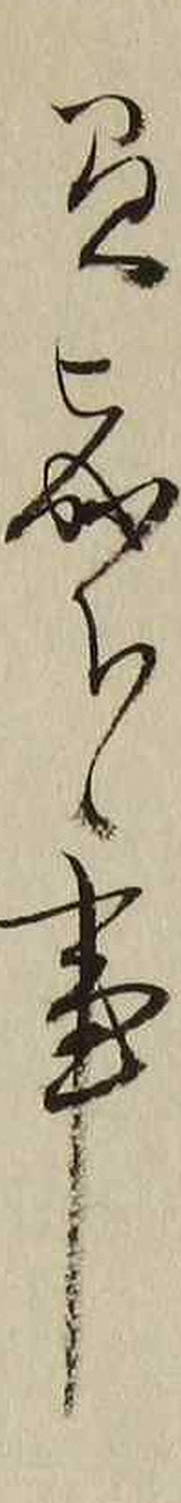美被成下候事
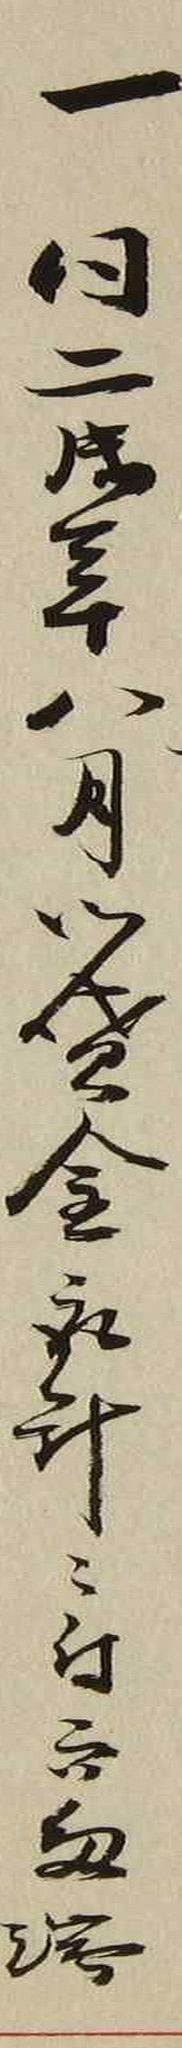一同二戌年八月御貸金取計ニ付而多端
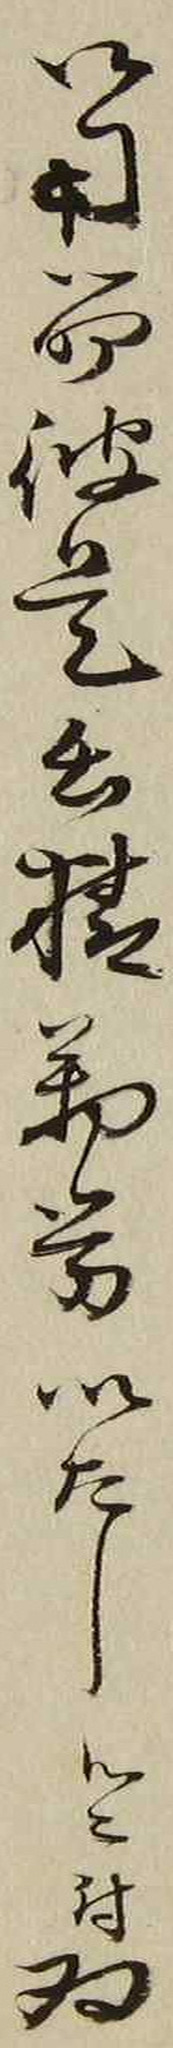御用筋彼是出精勤労いたし候ニ付為
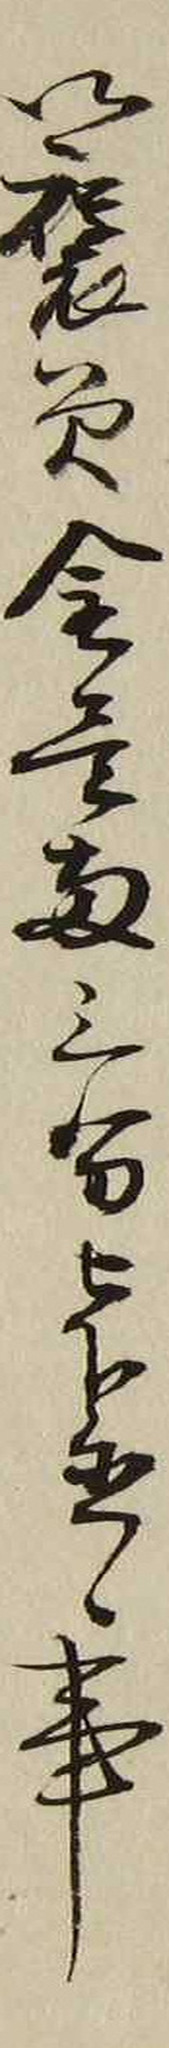御褒美金壱両三分被下置候事
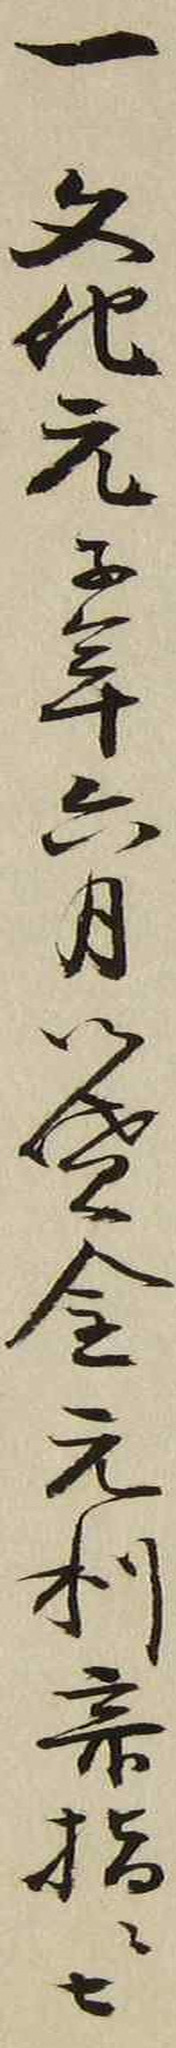一文化元子年六月御貸金元利棄指ニ被
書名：諸士系譜　巻之291　さ之部23
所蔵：会津若松市立会津図書館
